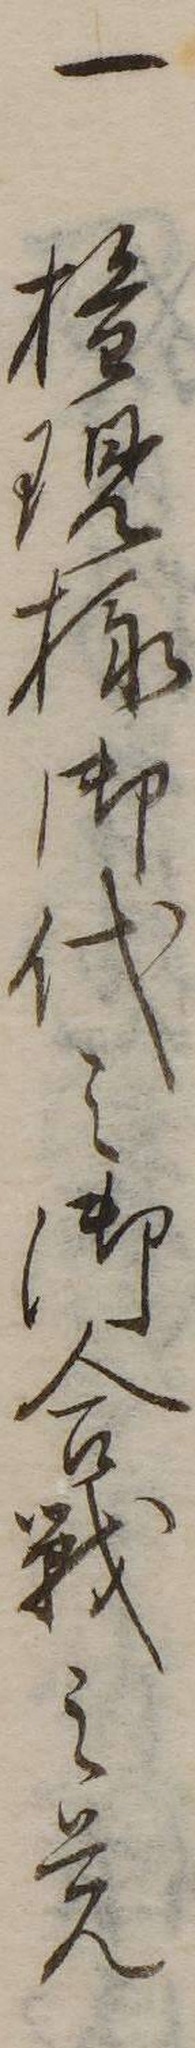一権現様御代之御合戦之覚
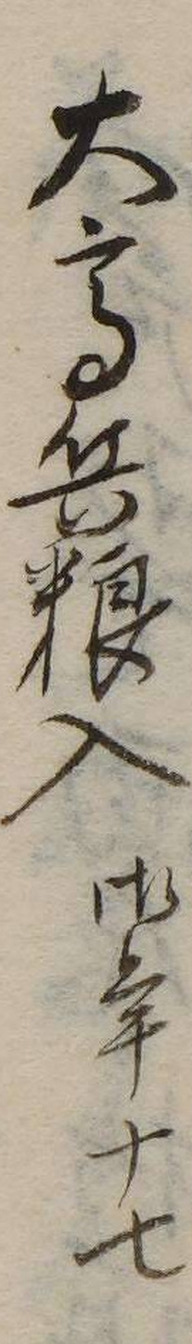大高兵糧入御年十七
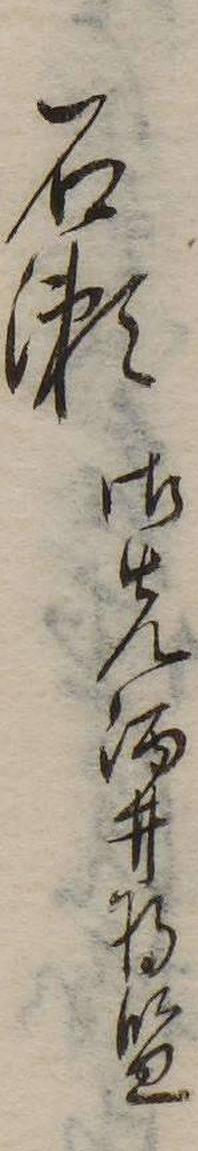石瀬御先酒井将監
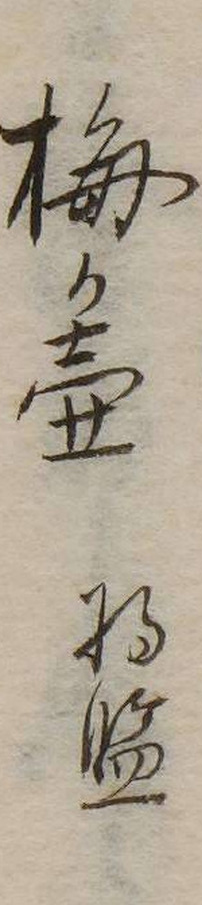梅か壺将監
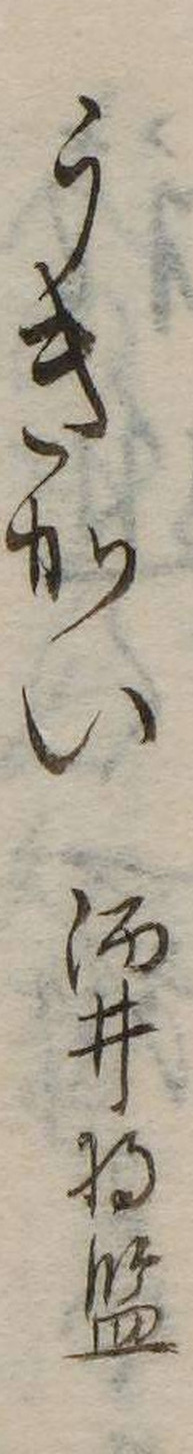うきかい酒井将監
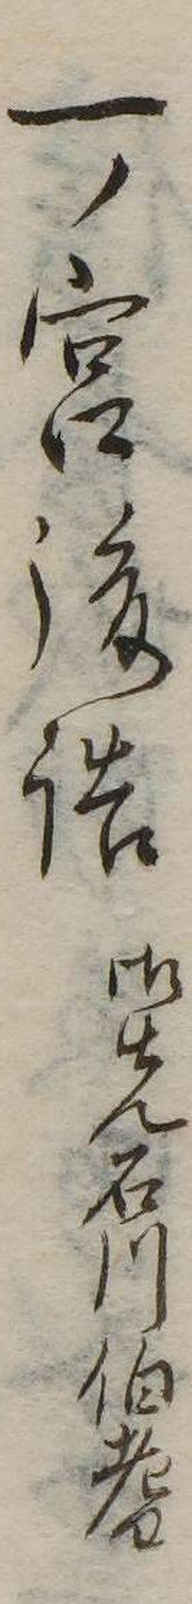一ノ宮後詰御先石川伯耆
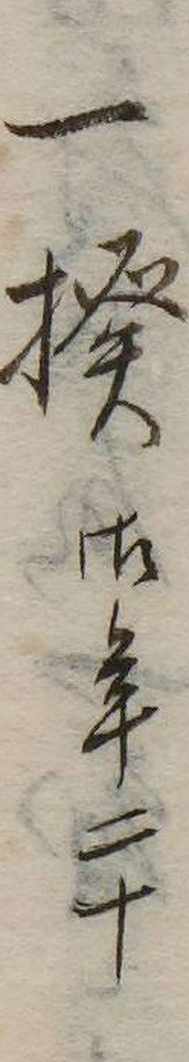一揆御年二十
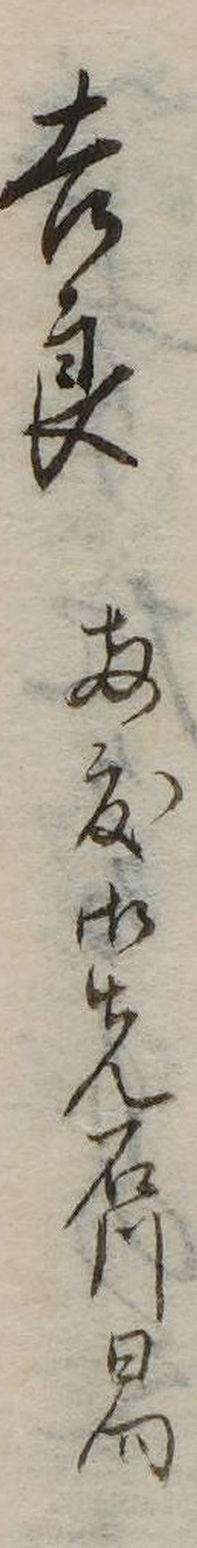吉良両度御先石川日向
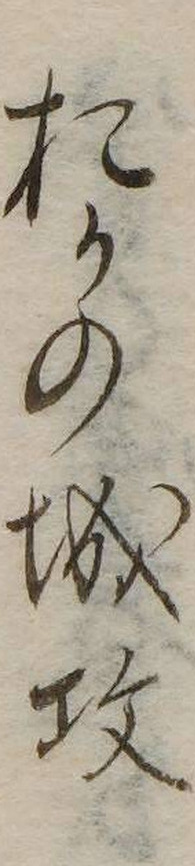たかの城攻
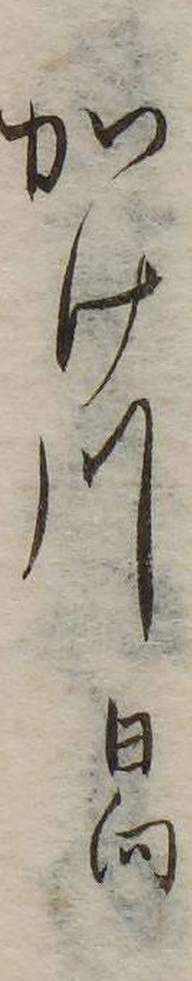かけ川日向
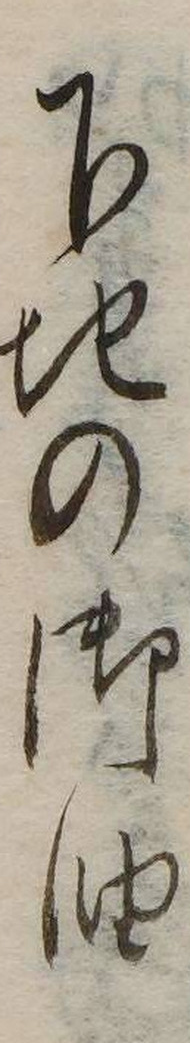下地の御油
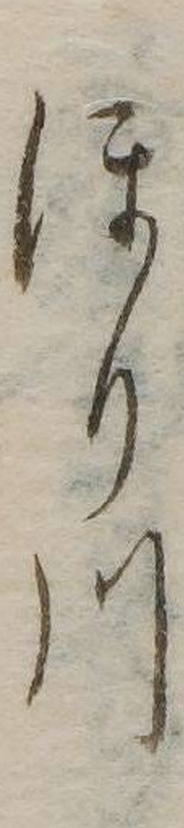ほり川
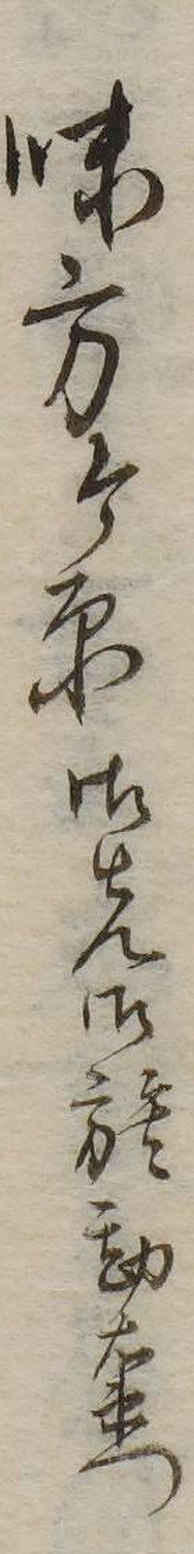味方ヶ原御先御旗勘右衛門
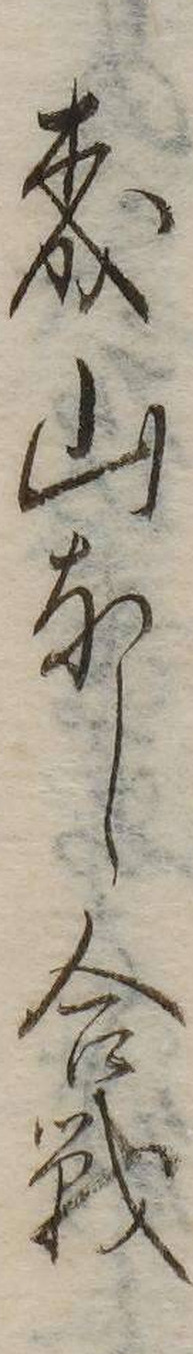森山なし合戦
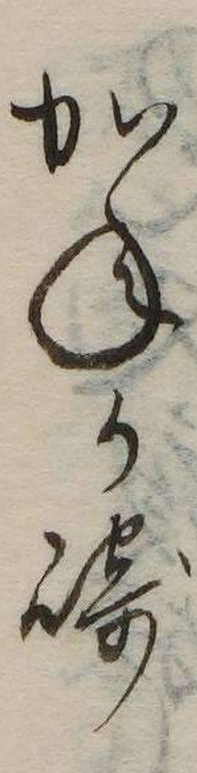かねか崎
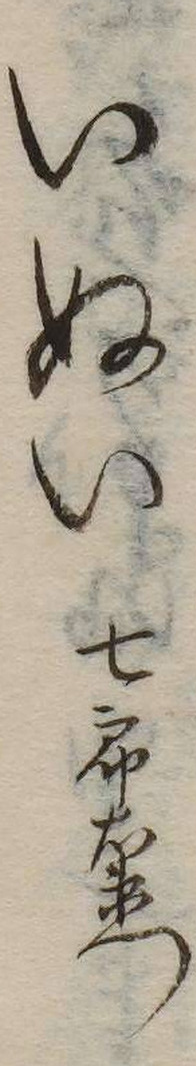いぬい七郎右衛門
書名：三河之物語
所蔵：国文学研究資料館
